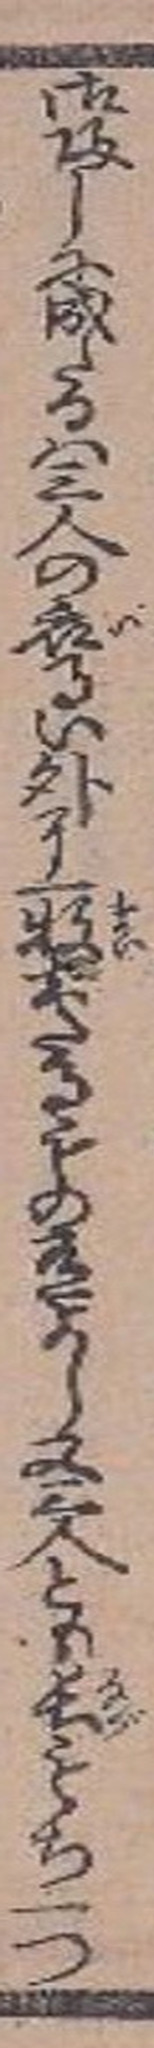御帰しに成たるは三人の衣るい外に一枚き？たるもの有よし又三人とも長もち一つ
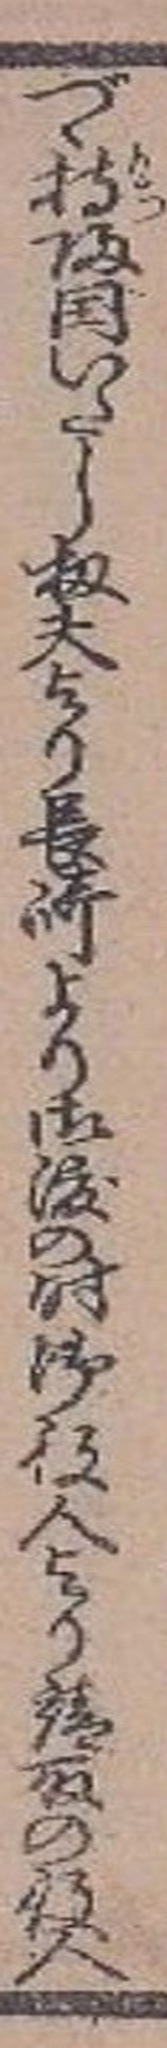づゝ持帰国いたし扨夫より長崎より御渡の時御役人より請取の役人
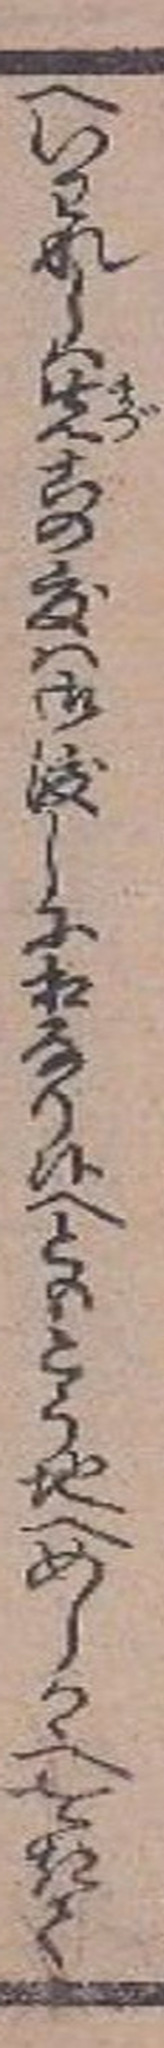へいわれしは先この度は御渡しに相なり候へともとう地へめしかゝへをきて
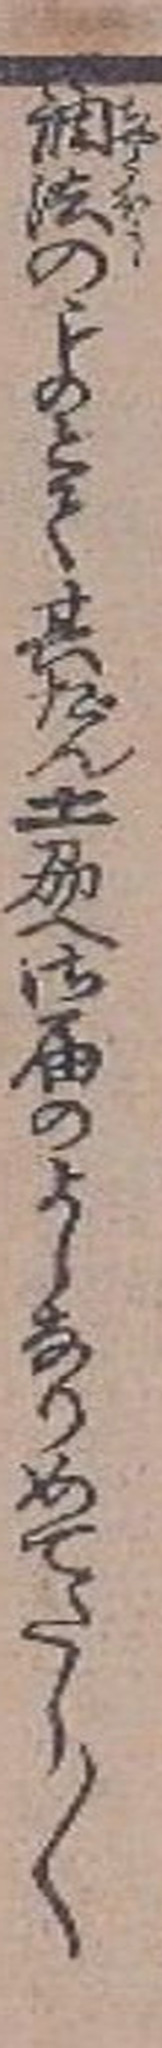調法のものとて其だん土州へ御届のよしなりめてたし〳〵
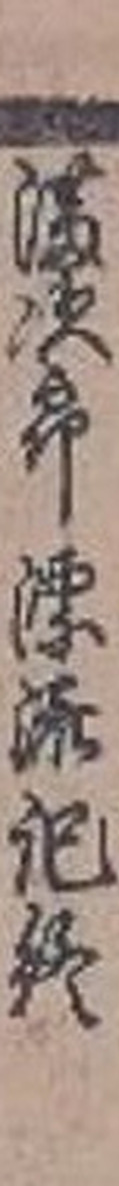満次郎漂流記終

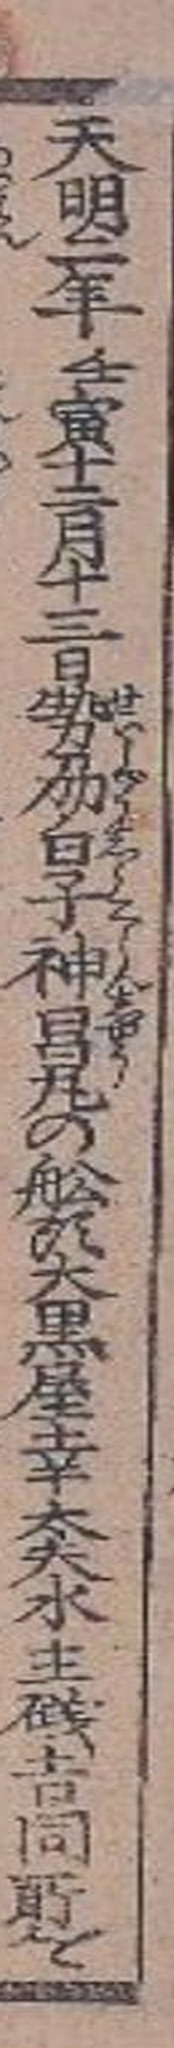天明二年壬寅十二月十三日勢州白子神昌丸の船頭大黒屋幸太夫水主磯吉同所を
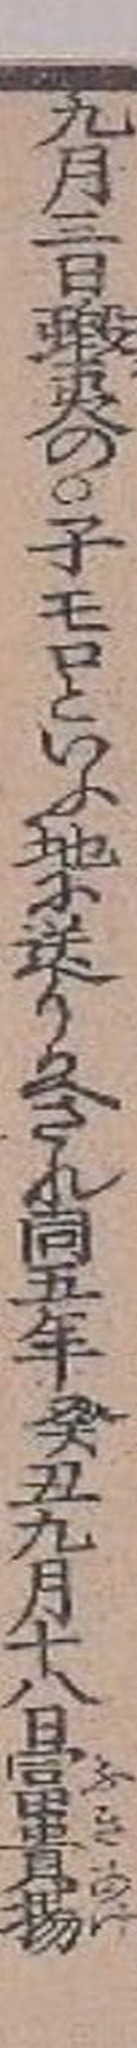九月三日蝦夷の○ネモロといふ地に送りかへされ同五年癸丑九月十八日富貴揚
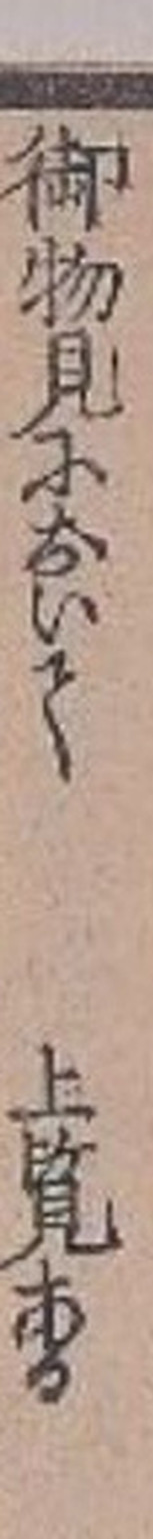御物見において上覧ある
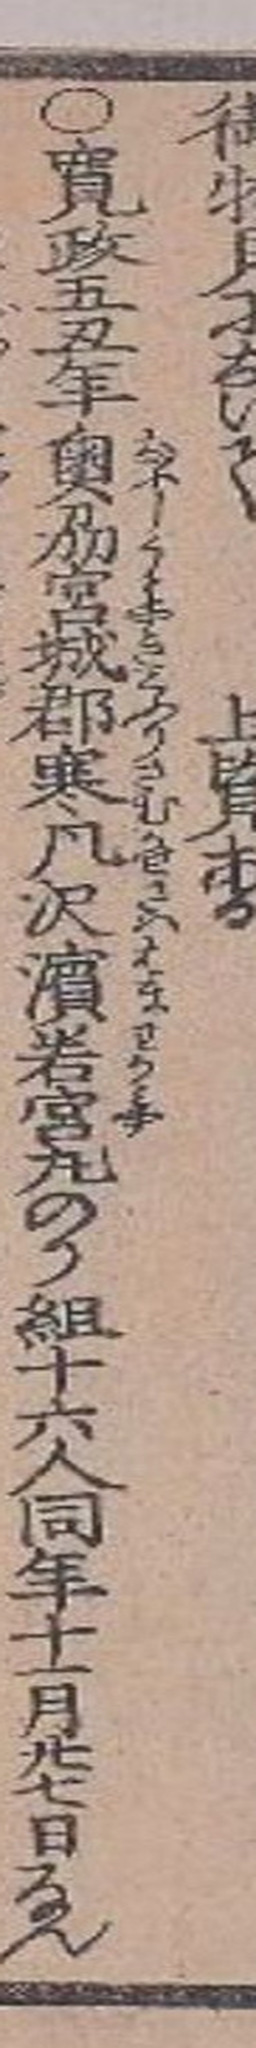○寛政五丑年奥州宮城郡寒風沢浜若宮丸のり組十六人同年十一月廿七日なん
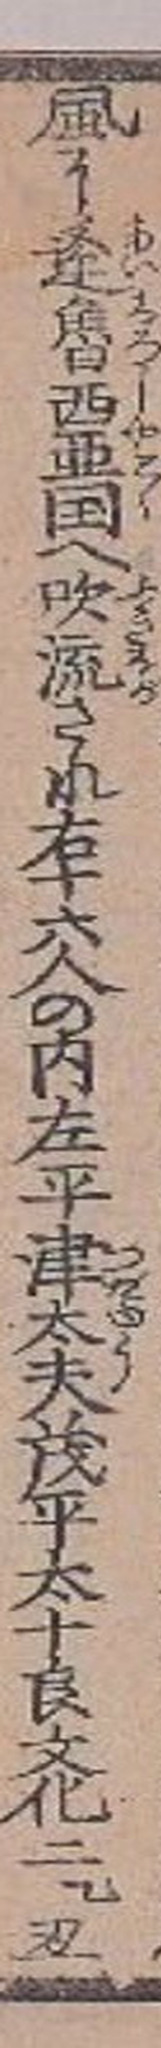風に逢魯西亜国へ吹流され右十六人の内左平津太夫茂平太十良文化二乙丑
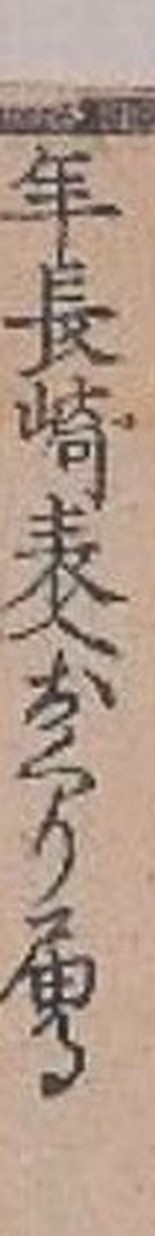年長崎表へおくり届る
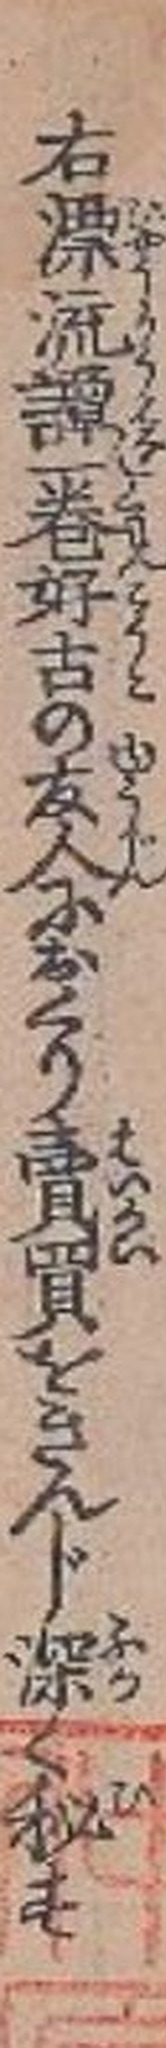右漂流譚一巻好古の友人におくり売買をきんじ深く秘す
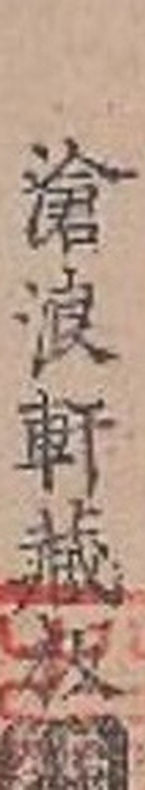滄浪軒蔵板
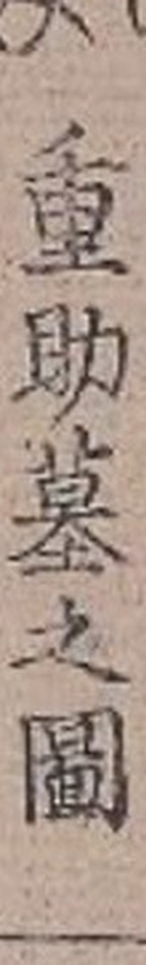重助墓之図
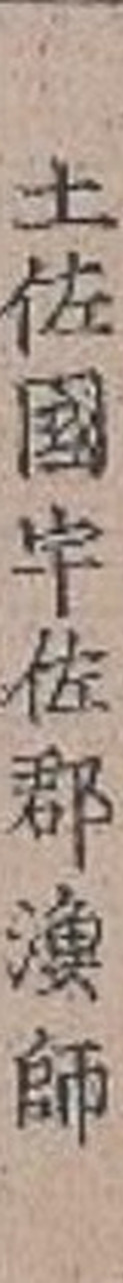土佐国宇佐郡漁師
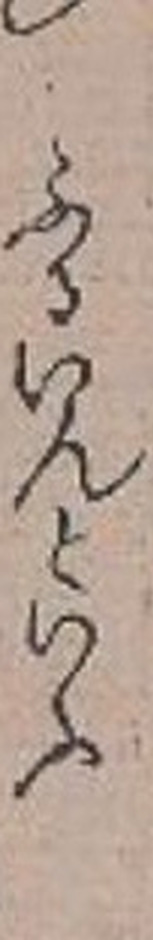ふるいんといふ
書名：満次郎漂流記
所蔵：University of the Ryukyus Library
